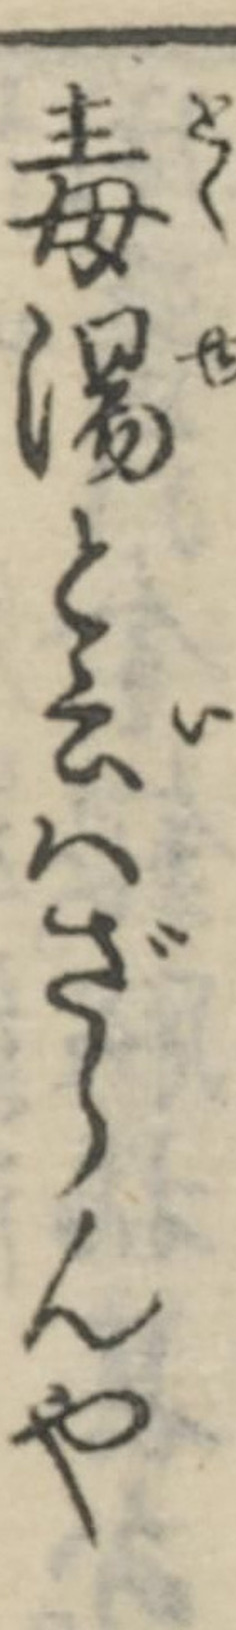毒湯と云はざらんや
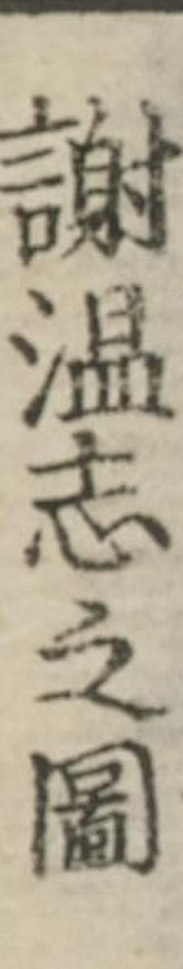謝温志之図
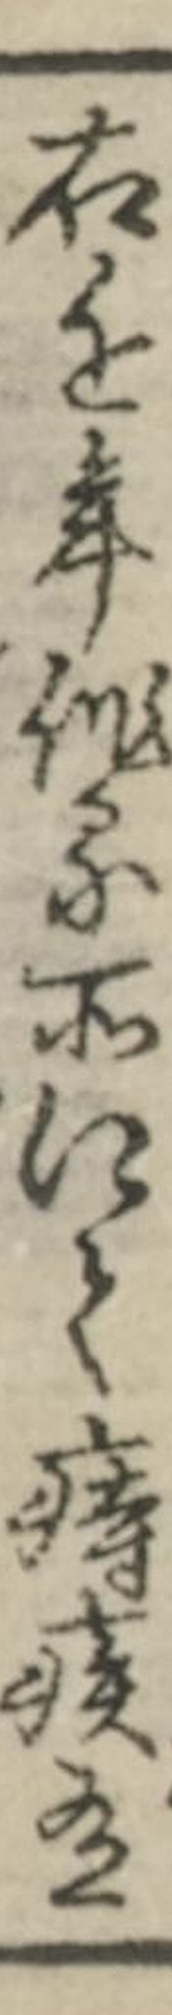右近年作る所にて痔疾有
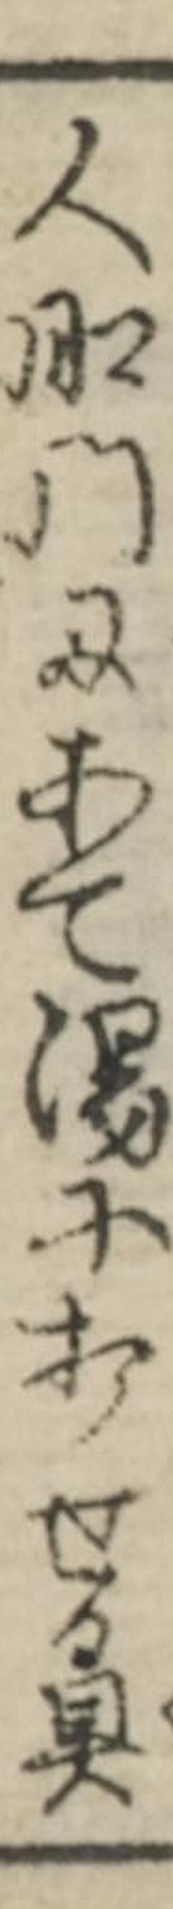人肛門にあて湯に打せる具
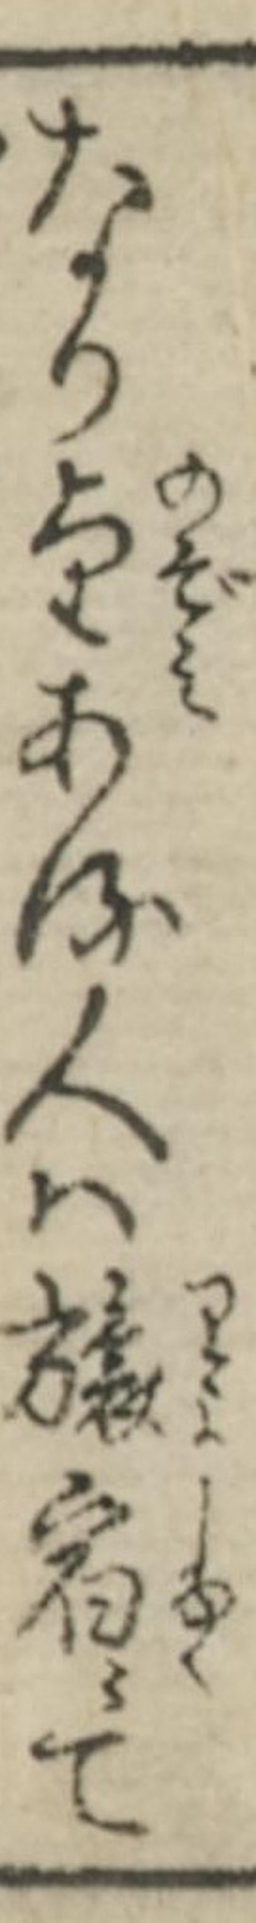なり望ある人は旅宿にて
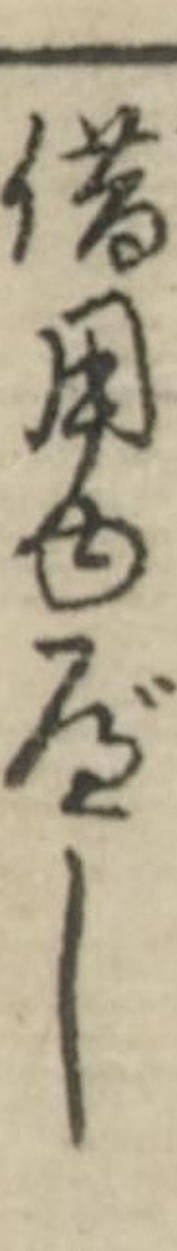借用ゆべし

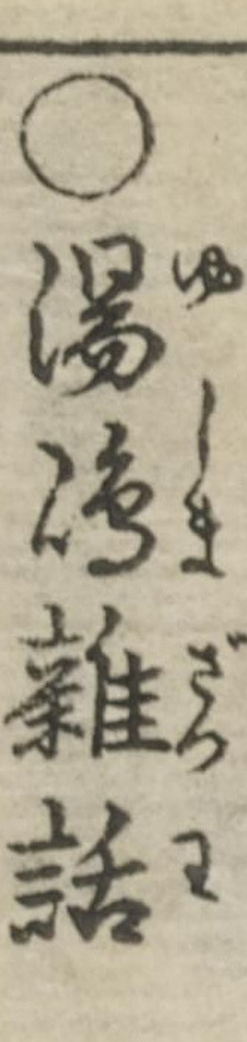○湯嶋雑話
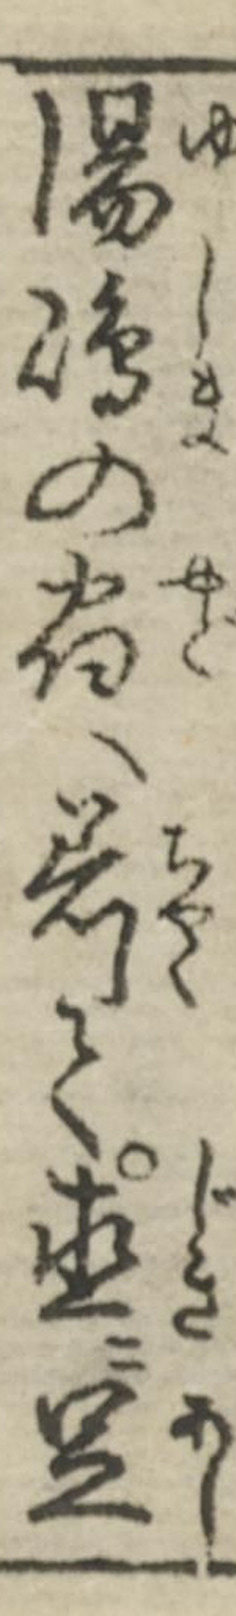湯嶋の宿へ着して。直に足
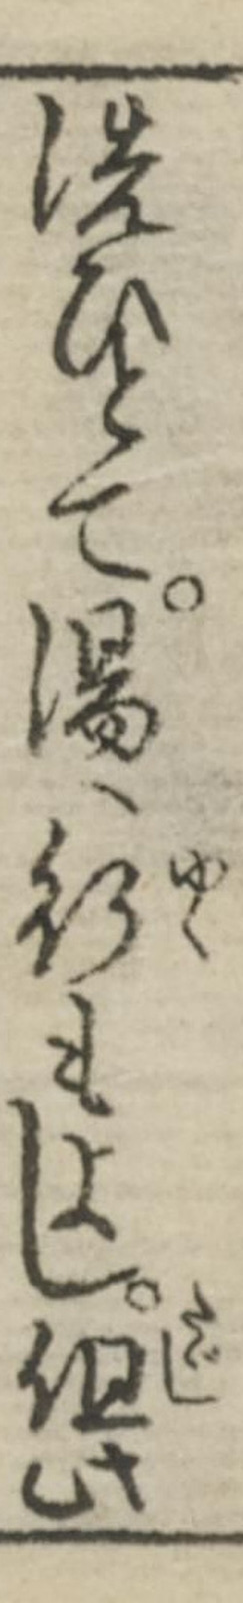洗ひとて。湯へ行もよし。但此
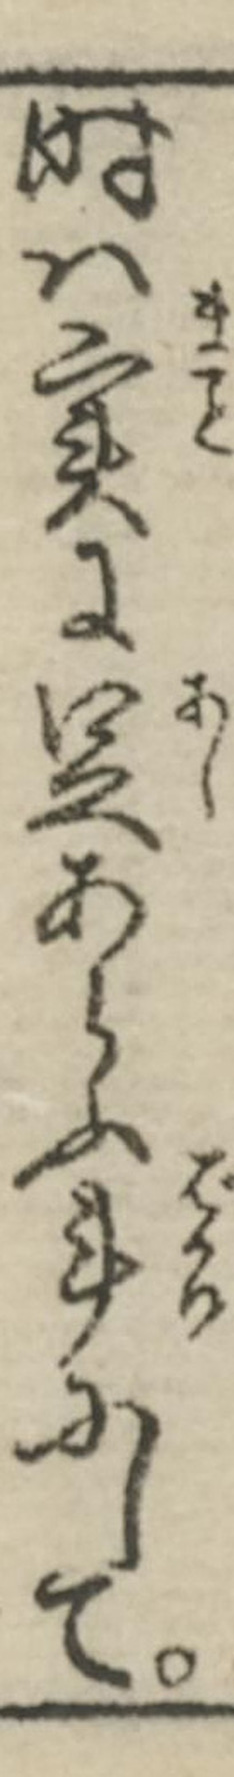時は実に足あらふ計にして。
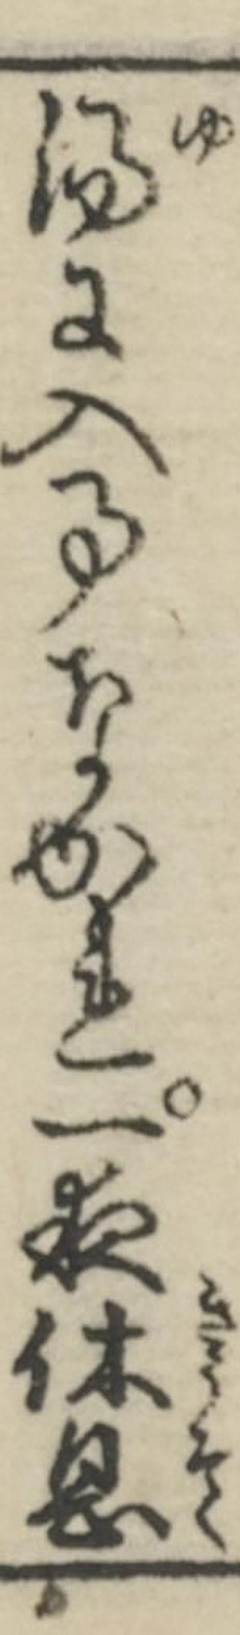湯に入事なかれ。一夜休息
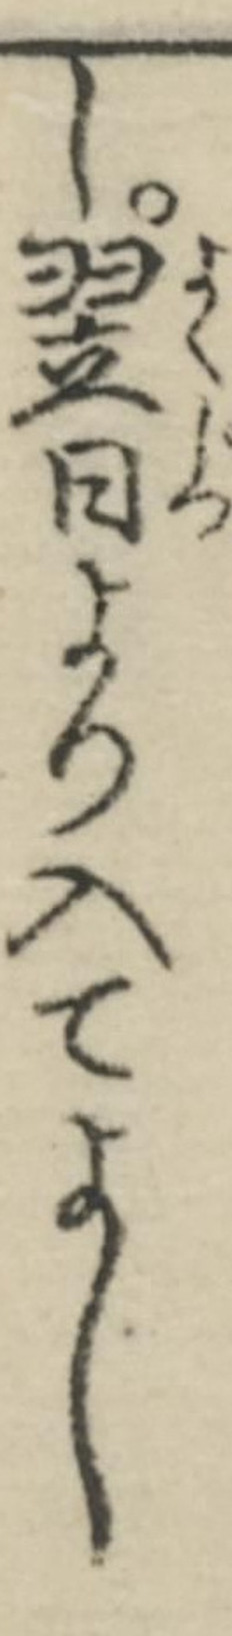し。翌日より入てよし
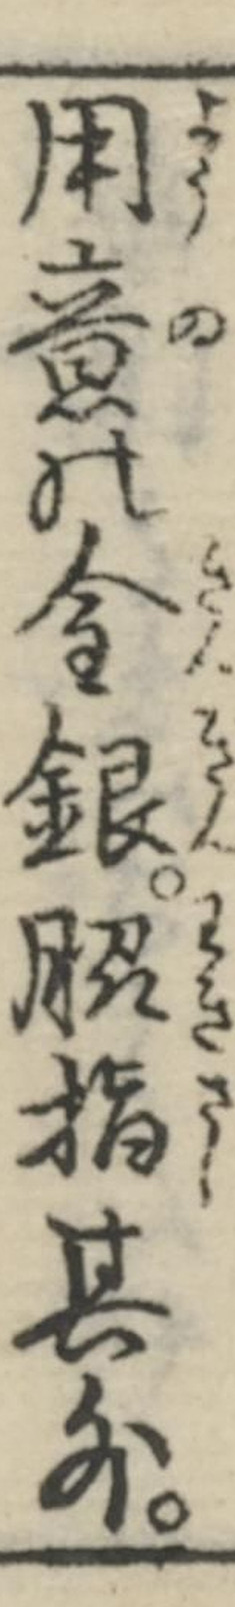用意の金銀。脇指其外。
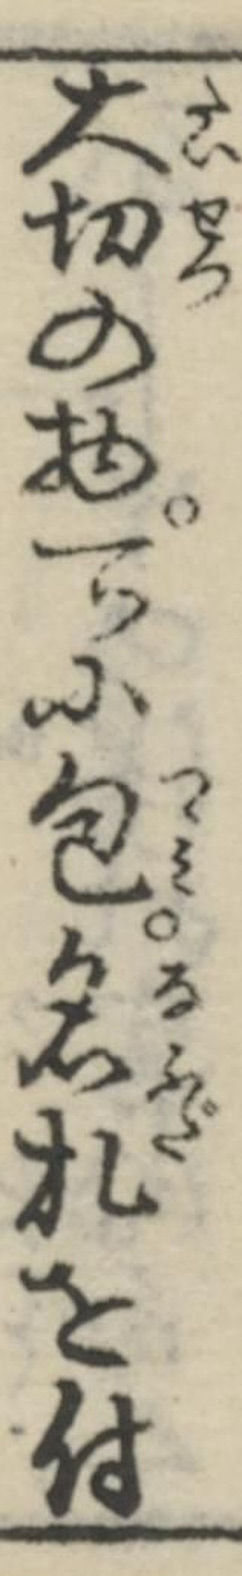大切の物。一つに包。名札を付
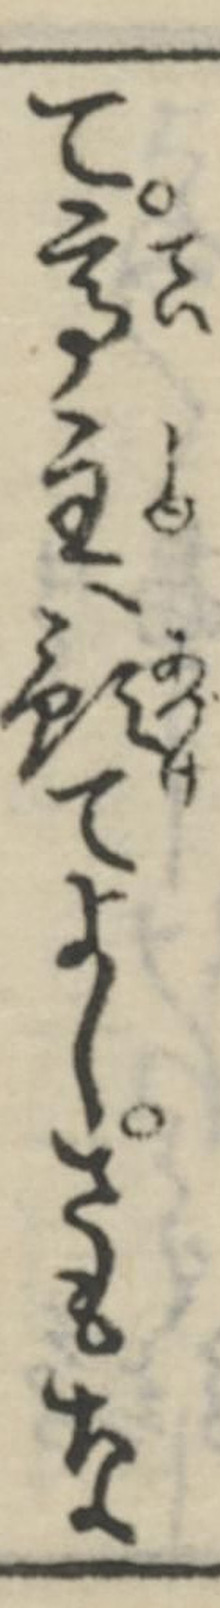て。亭主へ預てよし。さもな
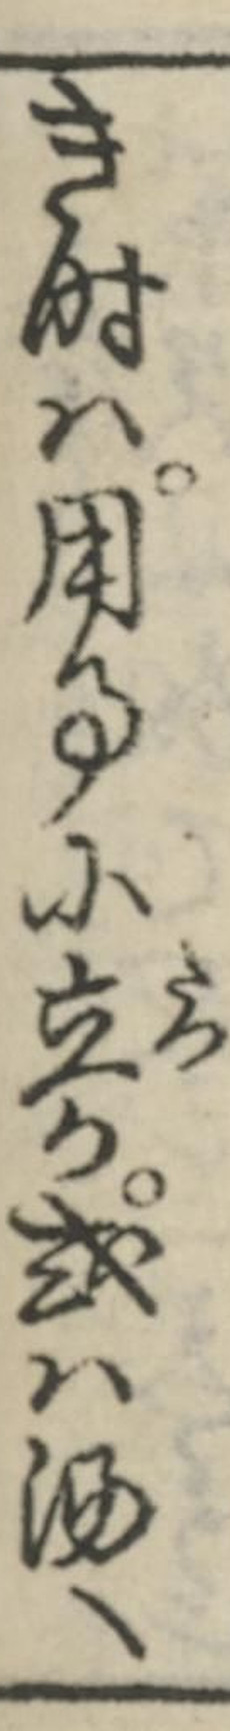き時は。用事に立か。或は湯へ
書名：但州城崎浴湯辧
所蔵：東京大学地震研究所図書室 Earthquake Research Institute Library, The University of Tokyo, JAPAN
